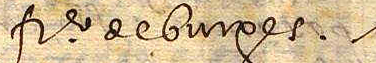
frco de burges.
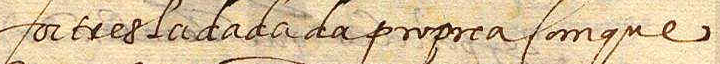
Foi tresladada da propria Com que
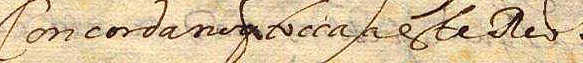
Concorda no que toca a este Reo.
